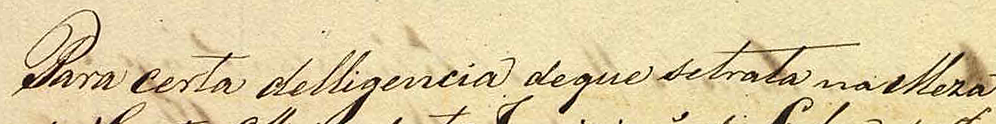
Para certa delligencia de que se trata na Meza
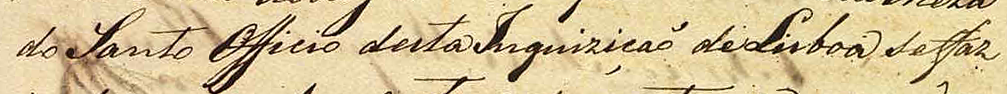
do Santo Officio desta Inquiziçaõ de Lisboa se faz
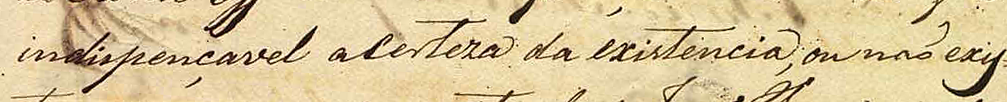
indipençavel a certeza da existencia, ou naõ exis
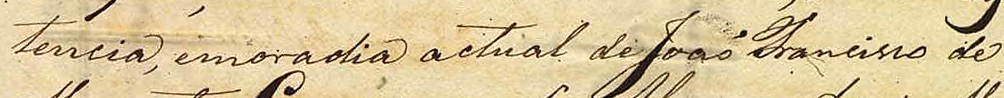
tencia, e moradia actual de Joaõ Francisco de
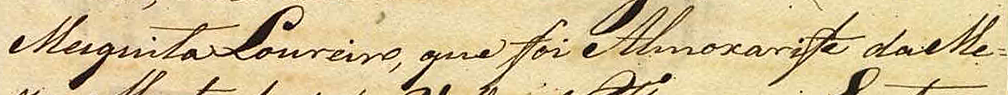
Mesquita Loureiro, que foi Almoxarife da Me
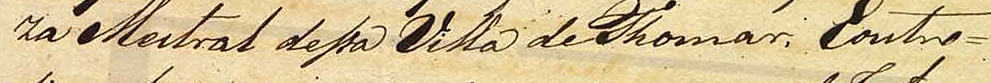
za Mestral desta Villa de Thomar: E outro
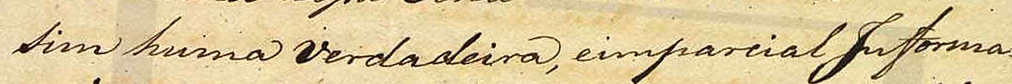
sim huma verdadeira, e imparcial Jnforma
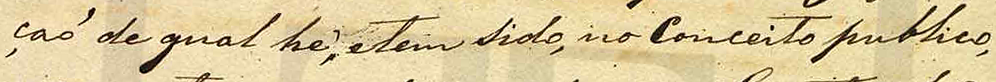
çaõ de qual he, e tem sido, no conceito publico,
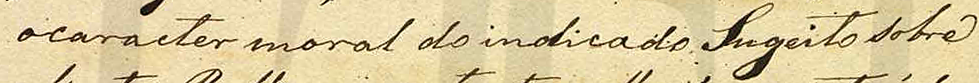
o carater moral do indicado Sugeito sobre
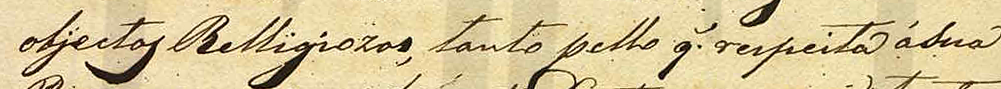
objectos Relligiozos, tanto pello q̄ respeita á sua
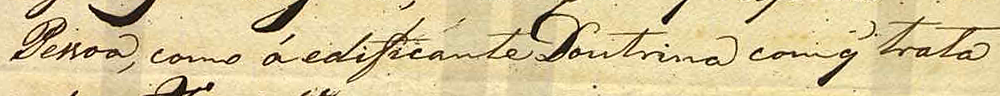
Pessoa, como á edificante Doutrina com q̄ trata
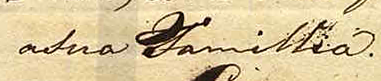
a sua Famillia.
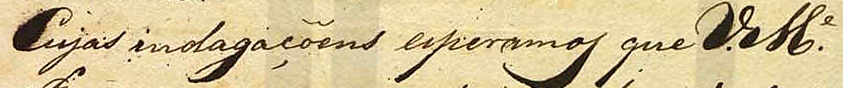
Cujas indagaçõens esperamos que V.M.e
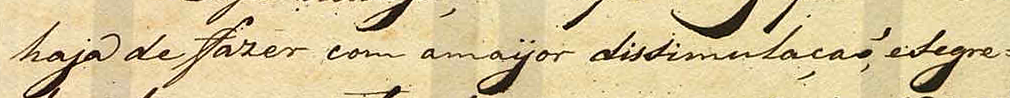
haja de fazer com a mayor dissimulaçaõ, e segre
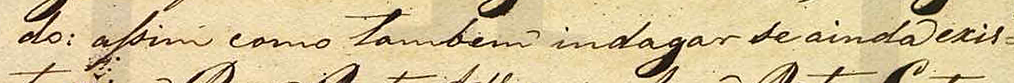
do: assim como tambem indagar se ainda exis
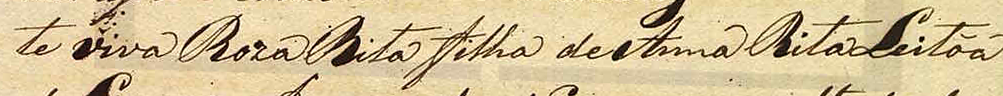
te viva Roza Rita filha de Anna Rita Leitoa
